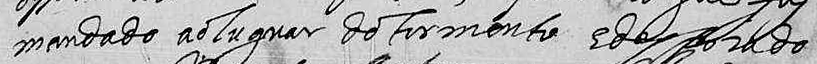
mandado ao luguar do tormento E despoiado
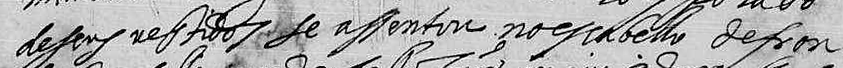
de seus uestidos se assentou no escabello defron
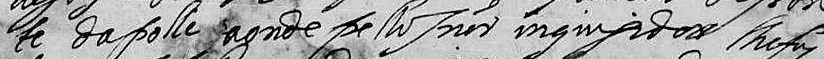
te da polle aonde pello snōr inquisidor lhe foy
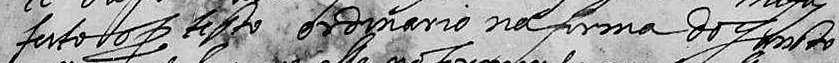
feito o ꝓtesto ordinario na forma do sancto
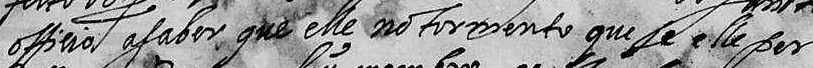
officio a saber que elle no tormento que se elle per
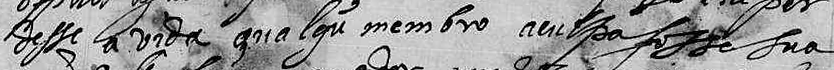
desse a vida ou algū membro a culpa fosse sua
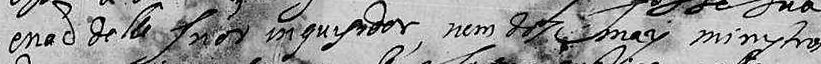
e naõ delle snor inquisidor nem dos mais ministros
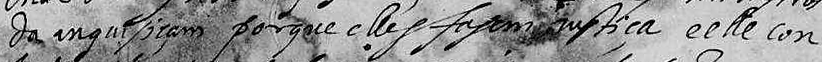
da inquisiçam porque elles fasem iustiça e elle con
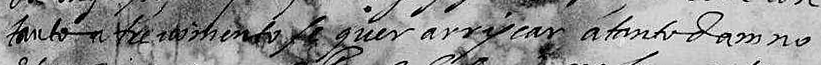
tanto atreuimento se quer arriscar a tanto damno
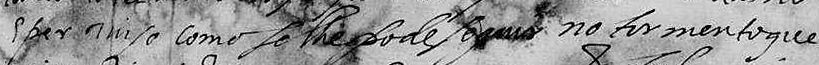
E per iuiso como se lhe pode seguir no tormento que
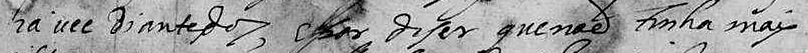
ia uee diante dos, E por diser que naõ tinha mais
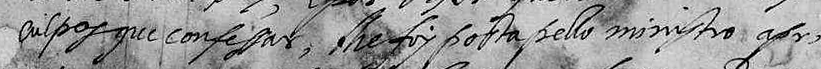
culpas que confessar, lhe foy posta pello ministro a pri
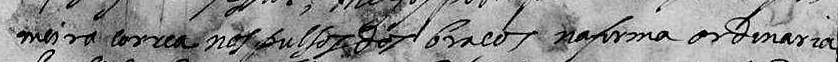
meira correa nos pulsos dos braços na forma ordinaria
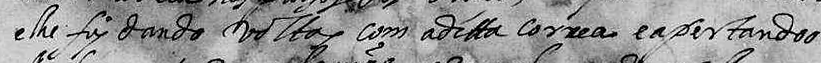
e lhe foy dando voltas com a ditta correa e apertandoo
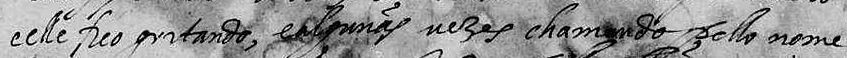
e elle Reo gritando, e alguuās uezes chamando pello nome
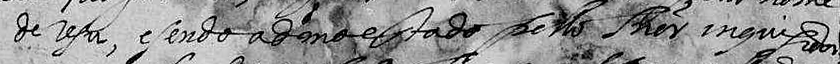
de iesu, e sendo admoestado pello snor̄ inquisidor
